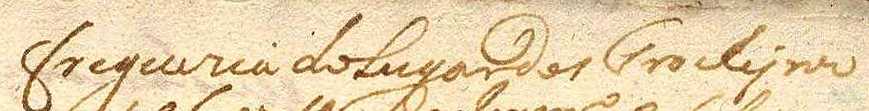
freguezia do Lugar dos Trochejros
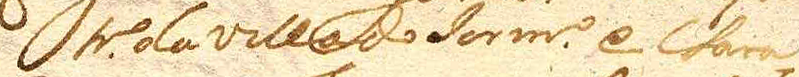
tr.o da villa do Ierm.o e Clara
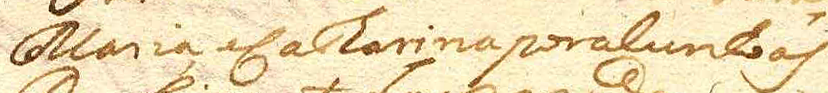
Maria, e Catharina por aCunho as
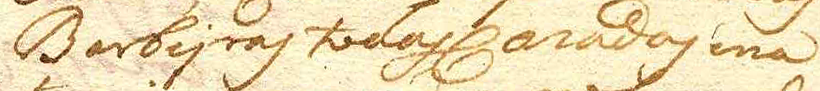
Barbejras todas Cazadas e na
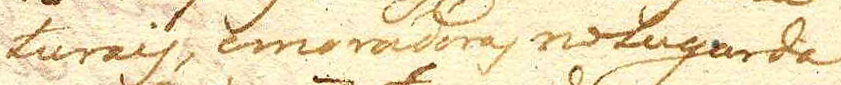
turais, e moradoras no Lugar da
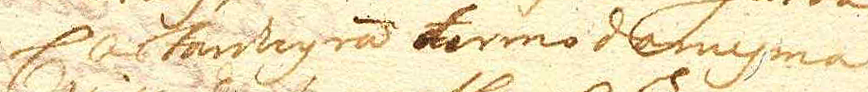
Castanheyra termo da mesma
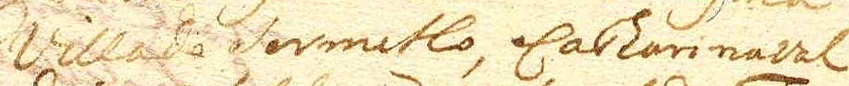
Villa do Iermello, e Catharina val
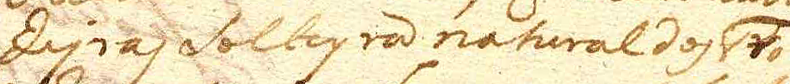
dejras solteyra natural dos Tro
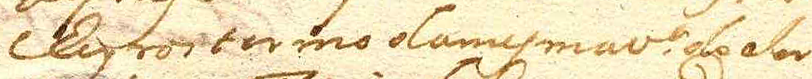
cheyros termo da mesma v.a do Ier
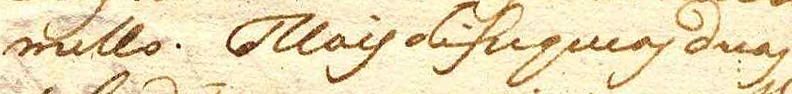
mello. Mais disse que as duas
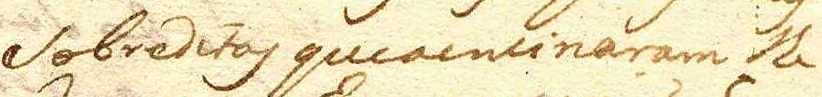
sobreditas que a ensinaram lhe
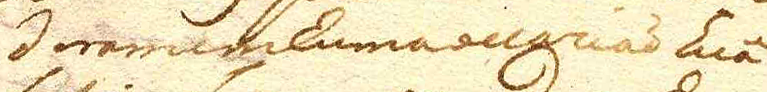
deram em huma occaziaõ huā
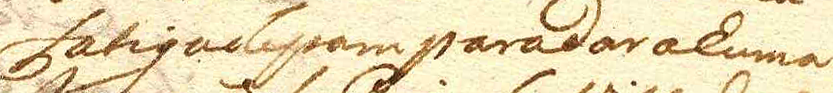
fatiga de pam para dar a huma
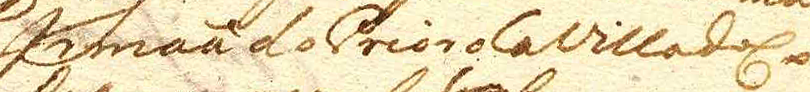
Jrmaã do Prior da Villa do Co
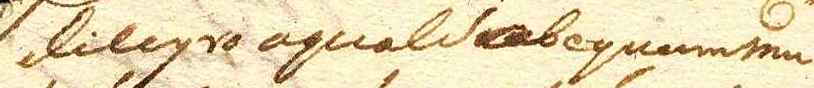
diceyro a qual sabe que em mu
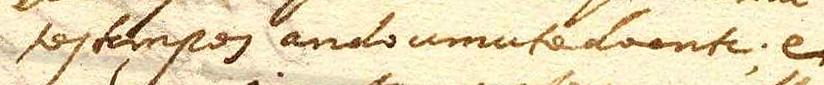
tos tempos andou muto doente; e
